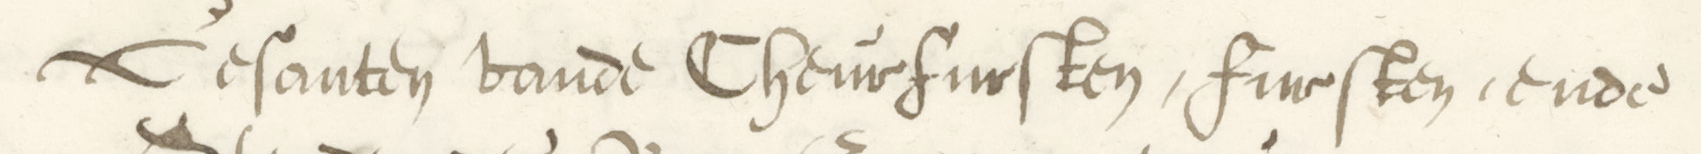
Gesanten vande Cheurfursten, fursten, ende
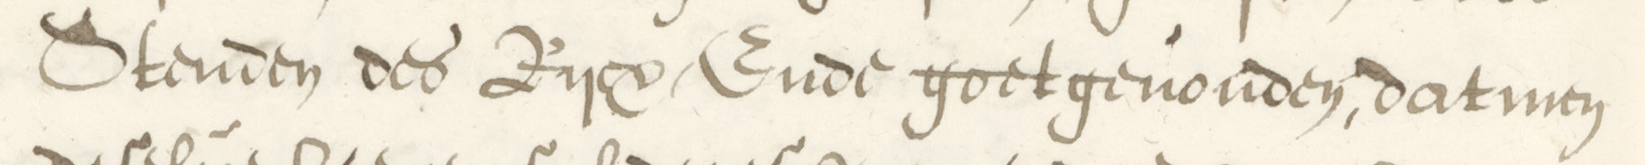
Stenden des Rycx. Ende goetgeuonden, datmen
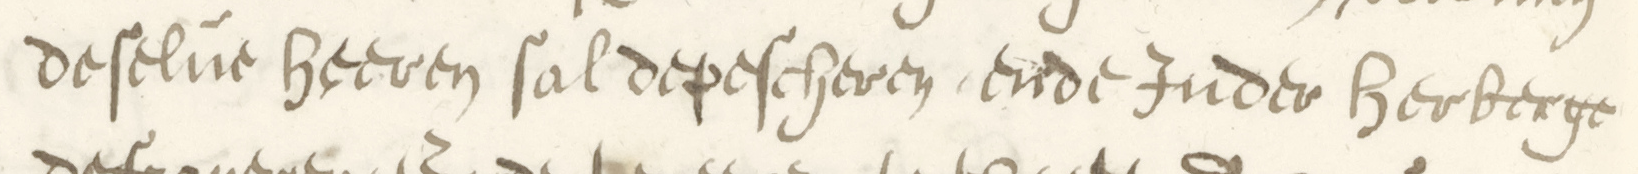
deselue heeren sal depescheren, ende Inder herberge
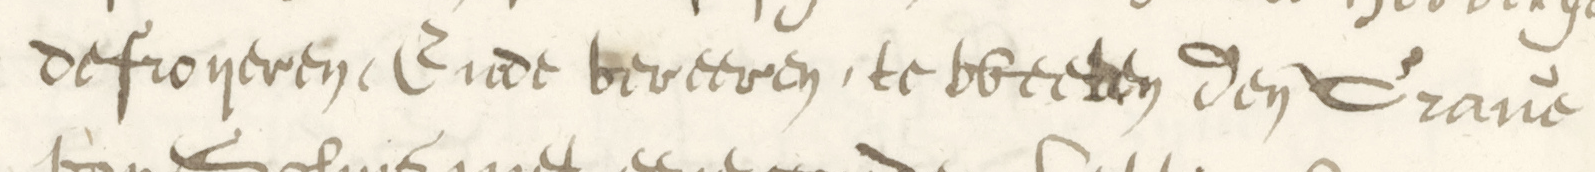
defroyeren, Ende vereeren, te weeten den Graue
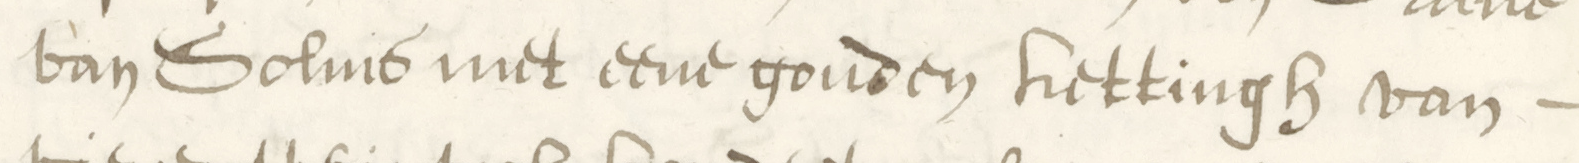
van Solms met eene gouden kettingh van -
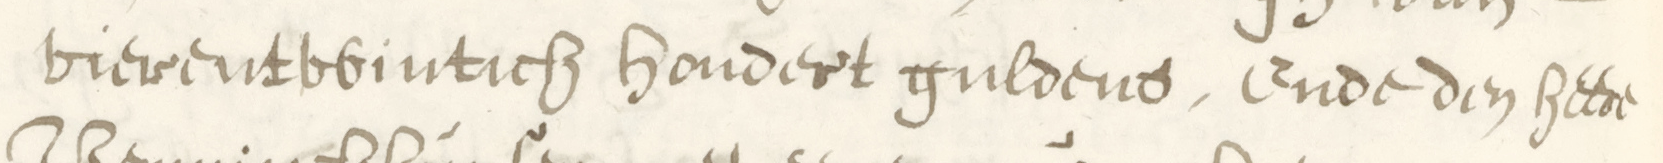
vierentwintich hondert guldens, Ende den heere
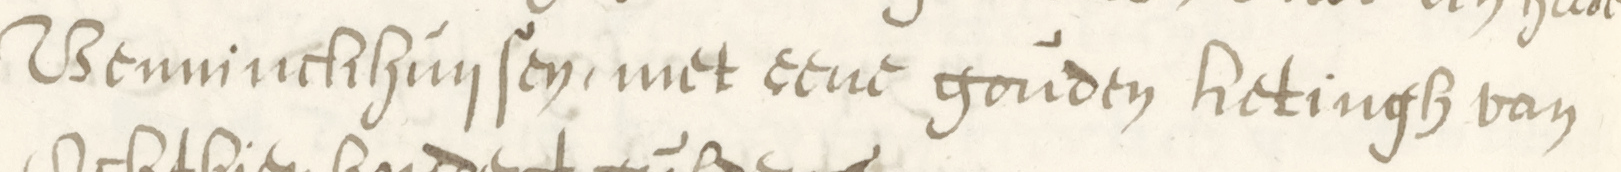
Benninckhuysen, met eene gouden ketingh van
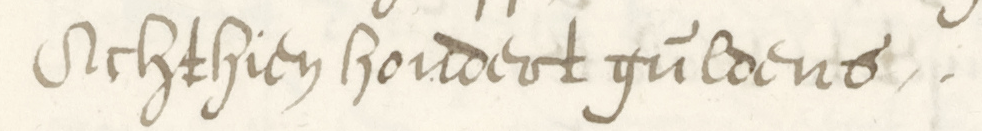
Achthien hondert guldens.
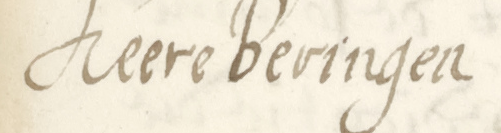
Heere Beringen
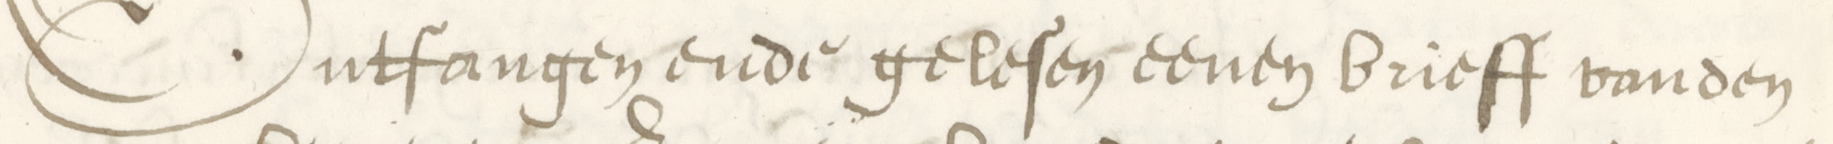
Ontfangen ende gelesen eenen brieff vanden
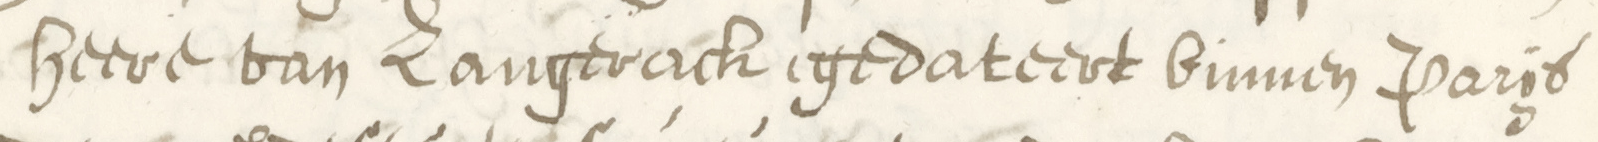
heere van Langerack, gedateert binnen Parys
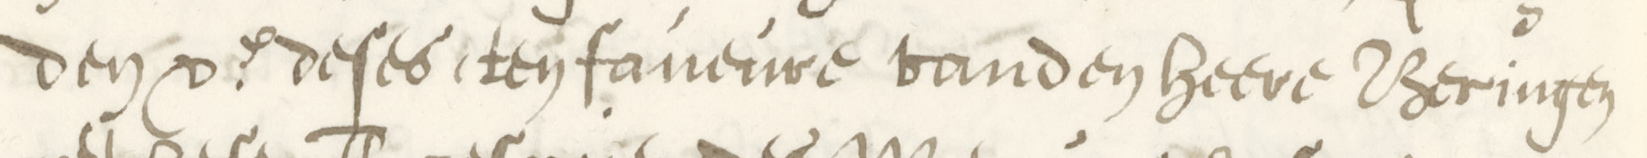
den xe. deses, ten faueure vanden heere Beringen
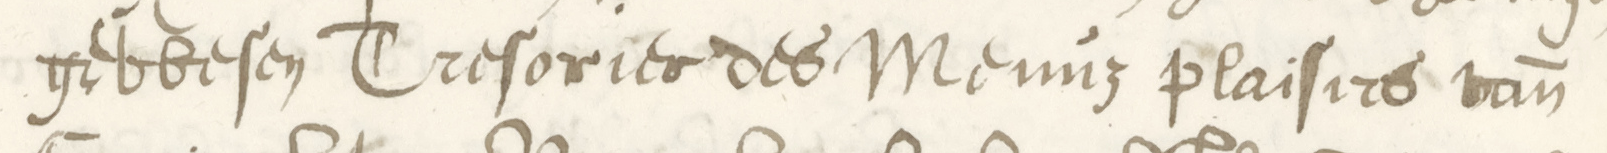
gewesen Tresorier des Menuz plaisirs van
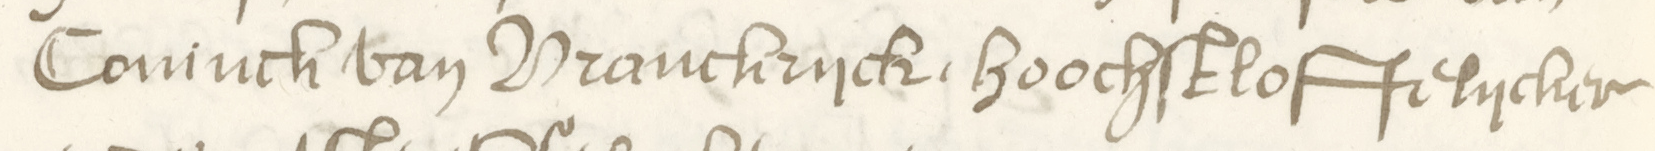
Coninck van Vranckryck, hoochstloffelycker
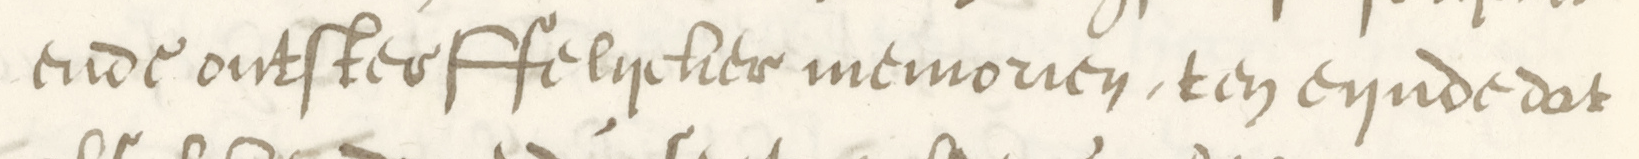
ende ontsterffelycker memorien, ten eynde dat
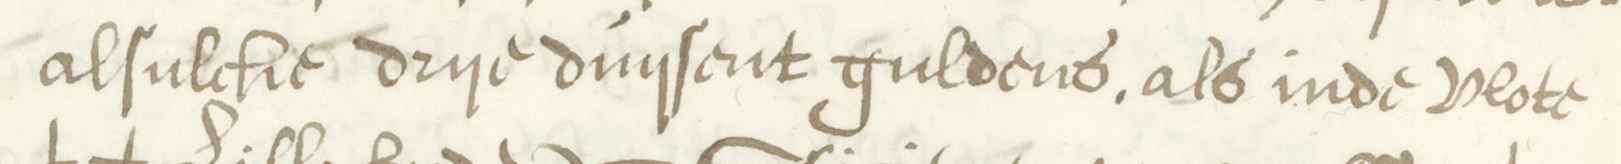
alsulcke, drye duysent guldens, als inde Vlote
